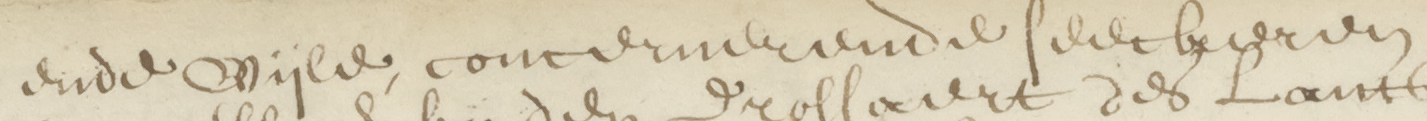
ende wijle, concernerende seeckeren
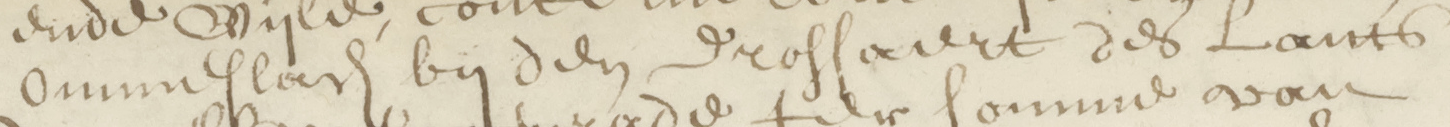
ommeslach bij den drossaert des Lants
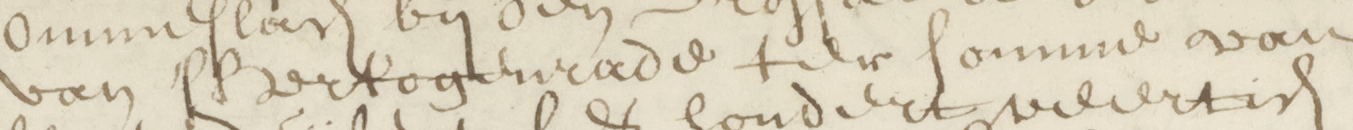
van 's Hertogenrade ter somme van
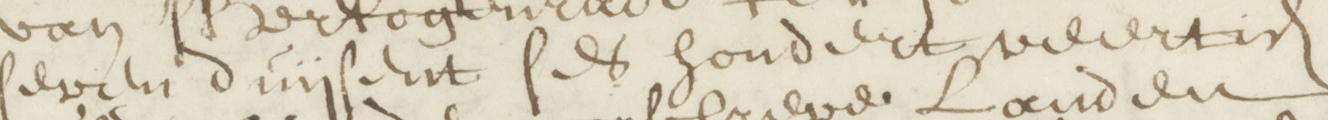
seven duijsent ses hondert veertich
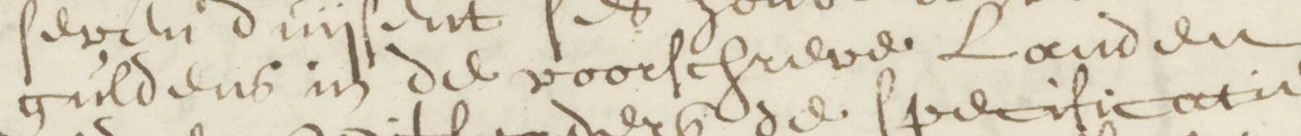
guldens in de voorschreve Landen
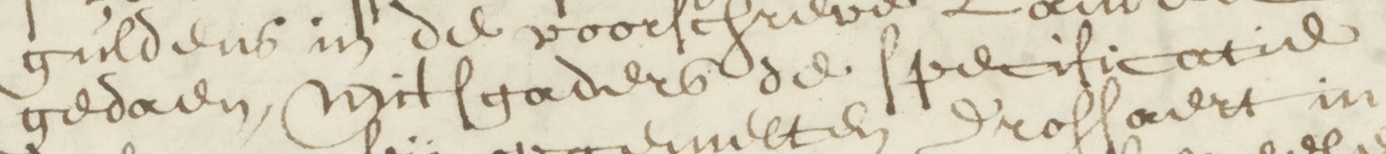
gedaen, mitsgaders de specificatie
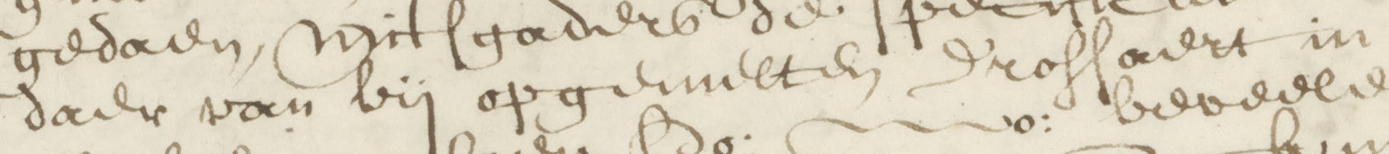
daer van bij opgemelten drossaert in
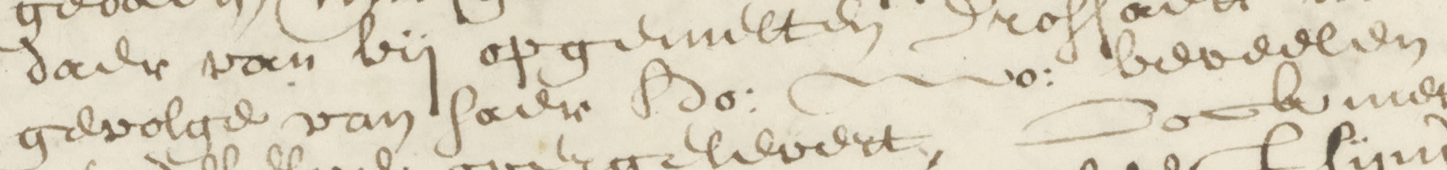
gevolge van haer ho:Mo: beveelen
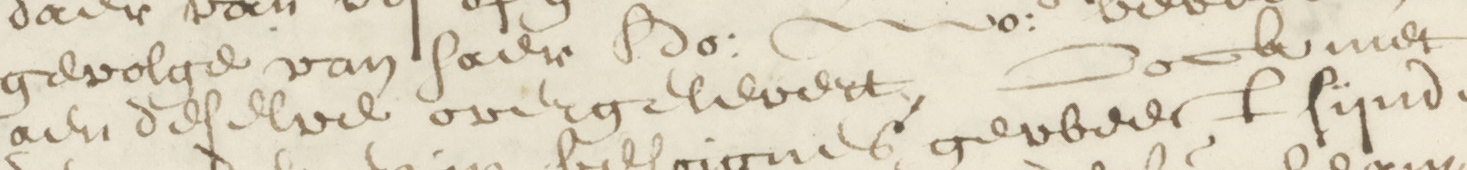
aen deselve overgelevert. Oock met
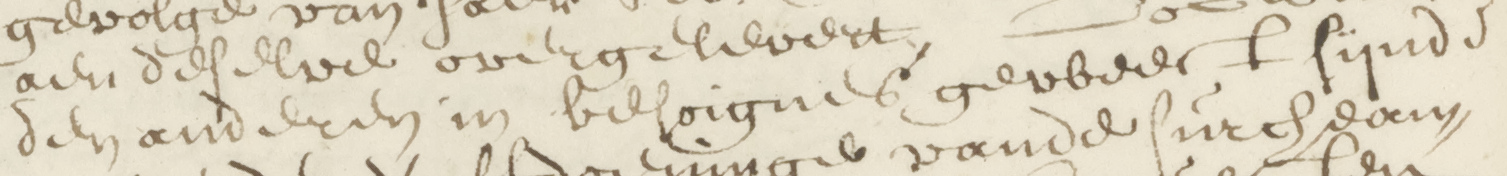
den anderen in besoignes geweest sijnde
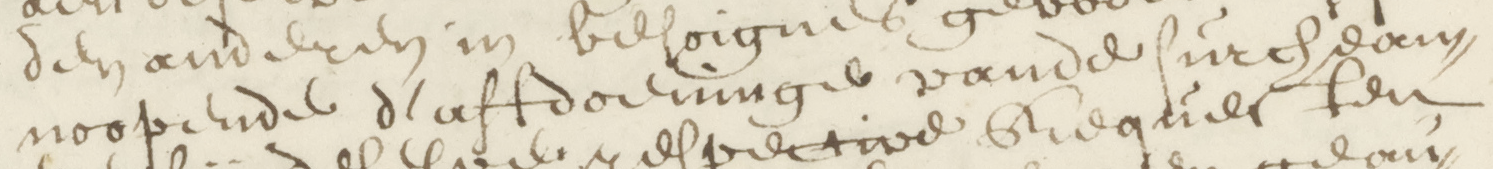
noopende d'affdoeninge vande surchean,,
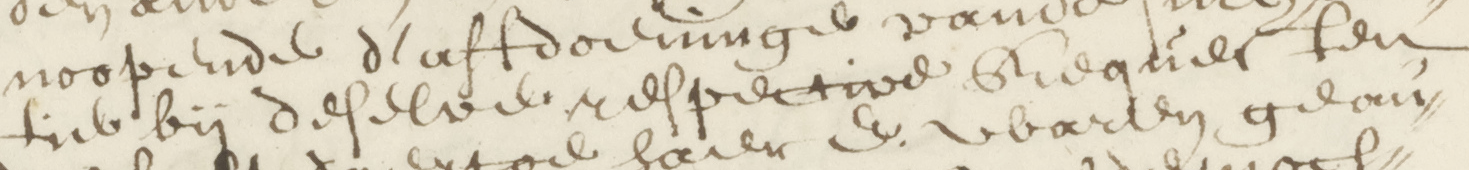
tie bij deselve respective Requesten
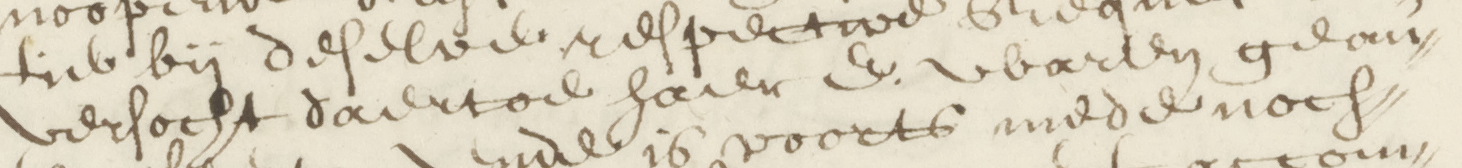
versocht daertoe haer E. waren geau,,
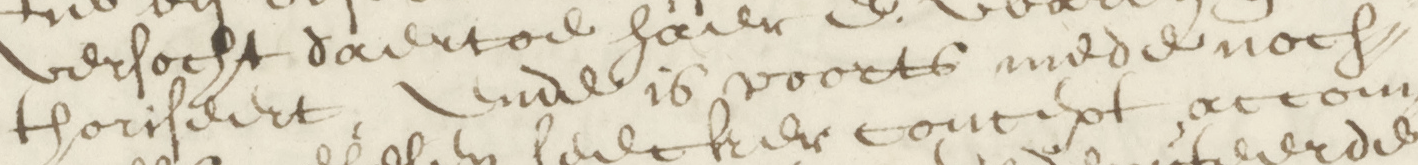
thoriseert ende is voorts mede noch„
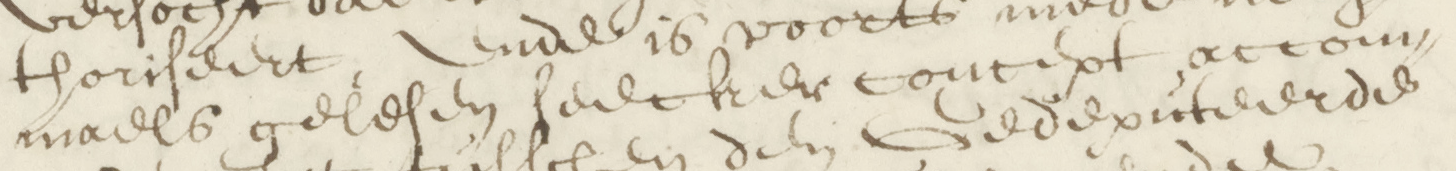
maels gelesen seecker concept accom,,
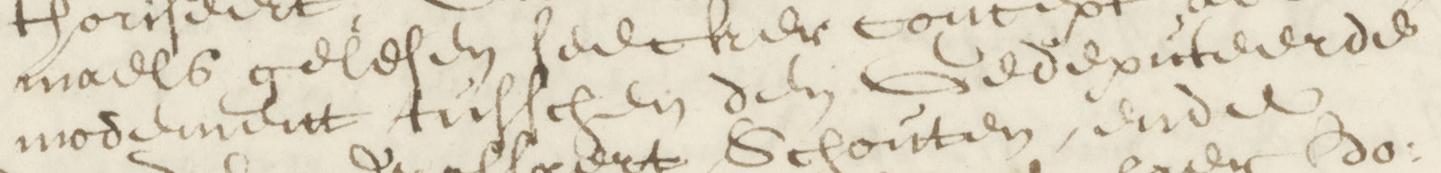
modement tusschen den Gedeputeerde
